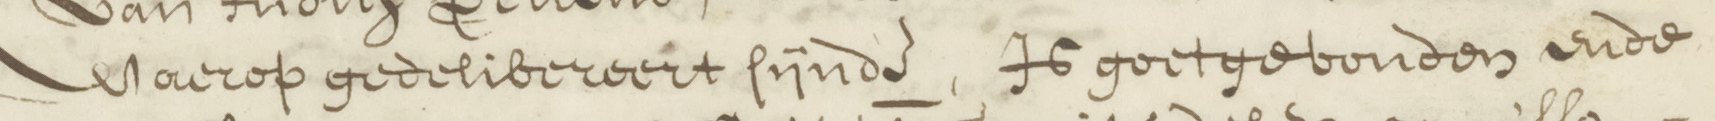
Waerop gedelibereert sijnde, Is goetgevonden ende
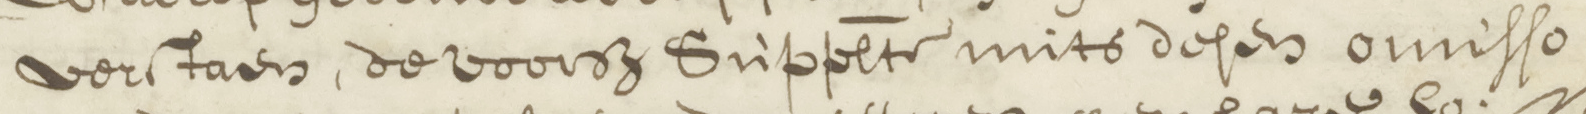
verstaen, de voorss Supplte mits desen omisso -
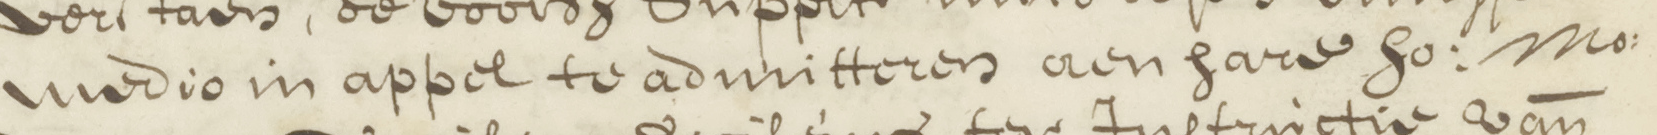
medio in appel te admitteren aen hare ho:Mo:
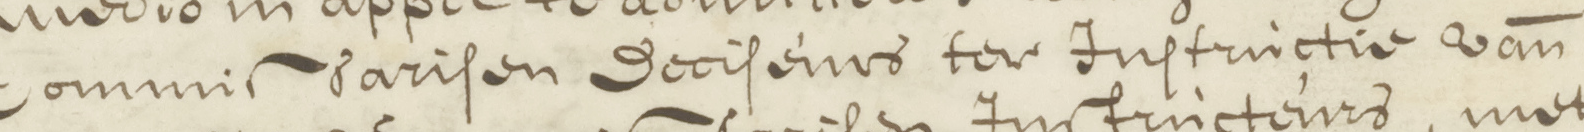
Commissarisen Deciseurs ter Instructie van
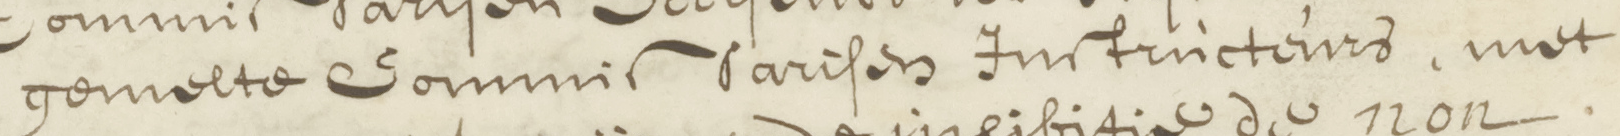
gemelte Commissarisen Instructeurs, met
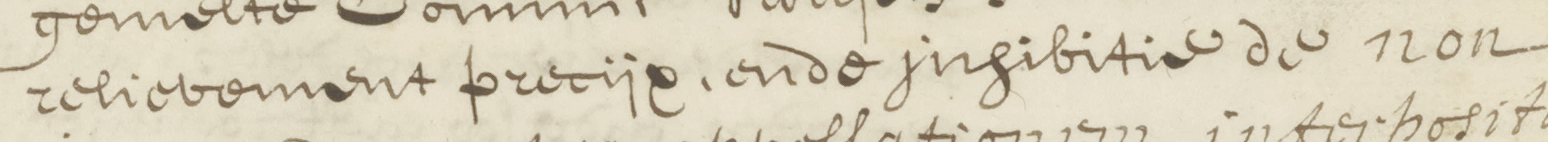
relievement precijx, ende inhibitie de non.
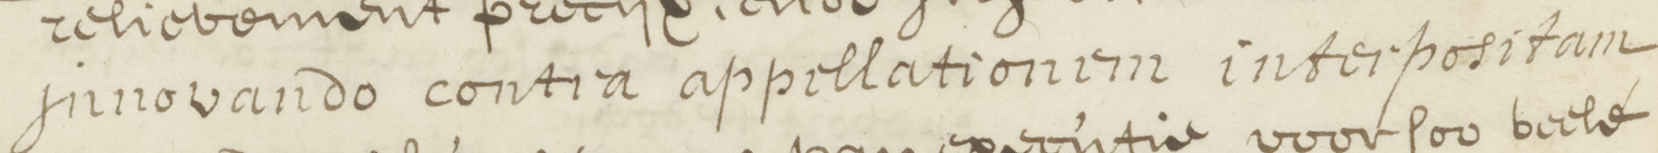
innovando contra appellationem interpositam
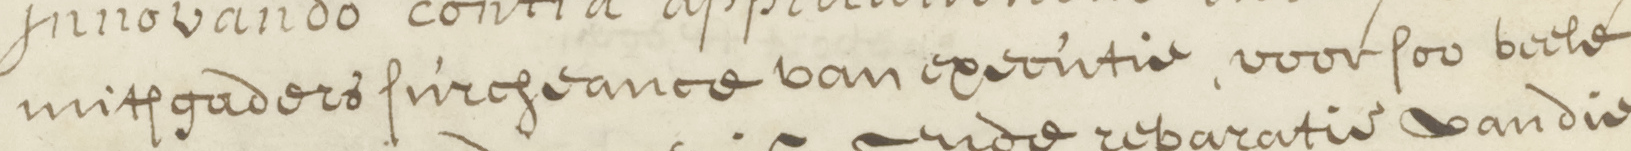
mitsgaders surcheance van executie, voor soo veele
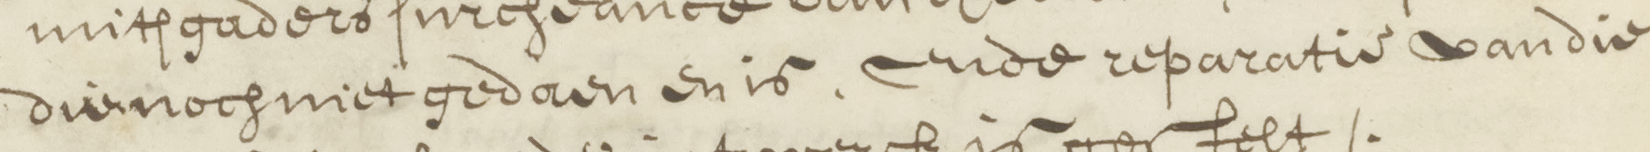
die noch niet gedaen en is. Ende reparatie van die
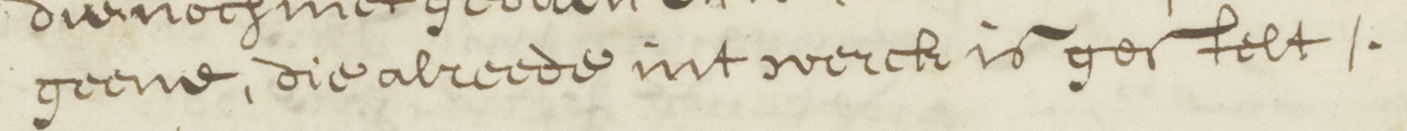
geene, die alreede int werck is gestelt.
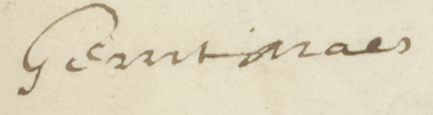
Gerrit maes
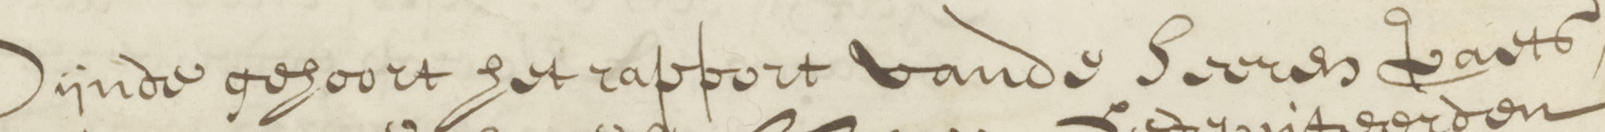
Sijnde gehoort het rapport vande heeren Paets,
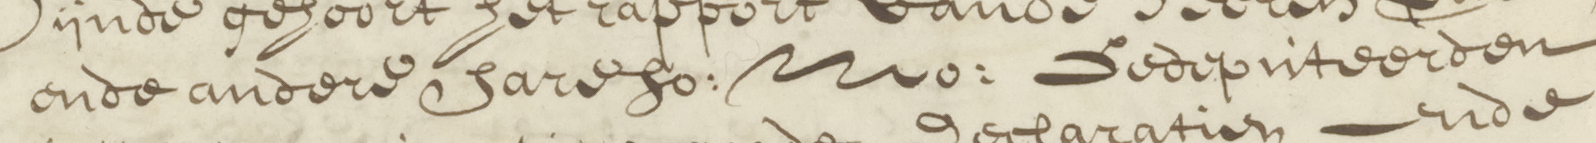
ende andere hare ho:Mo: Gedeputeerden
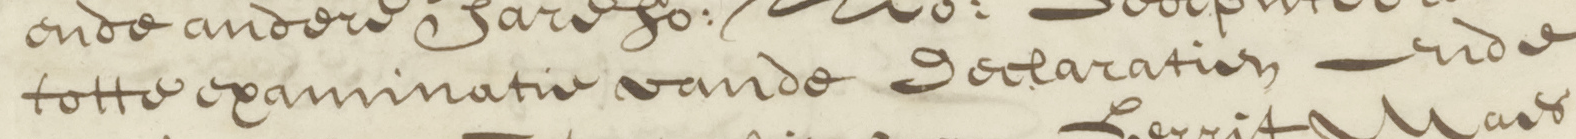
totte examinatie vande Declaratien ende
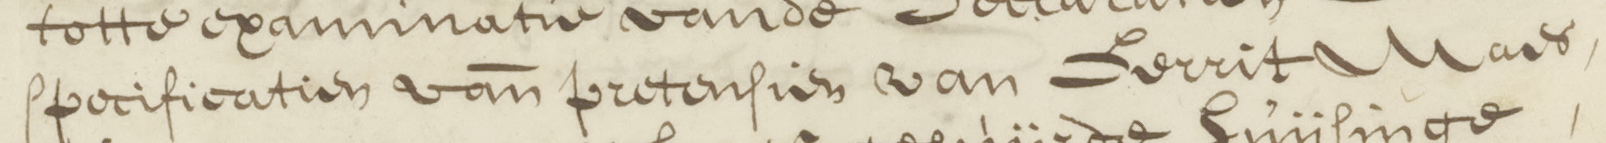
specificatien van pretensien van Gerrit Maes
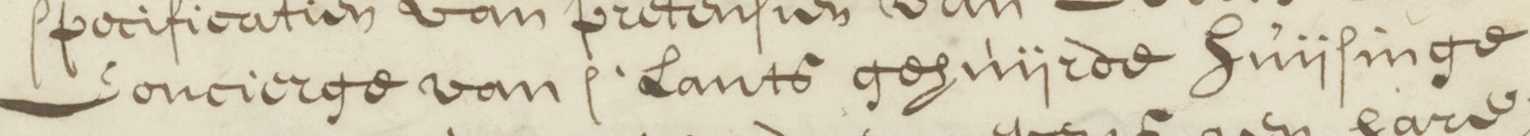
Concierge van s‛ Lants gehuijrde Huijsinge,
